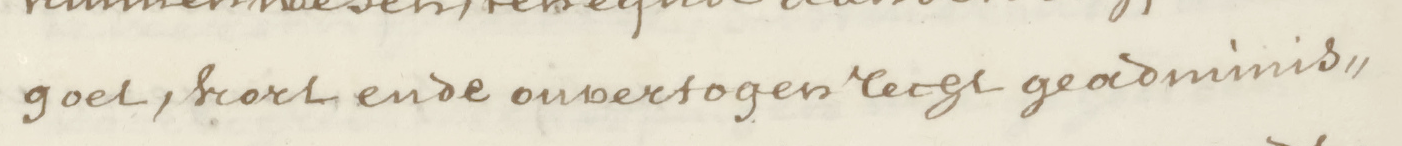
goet, kort ende onvertogen recht geadminis„
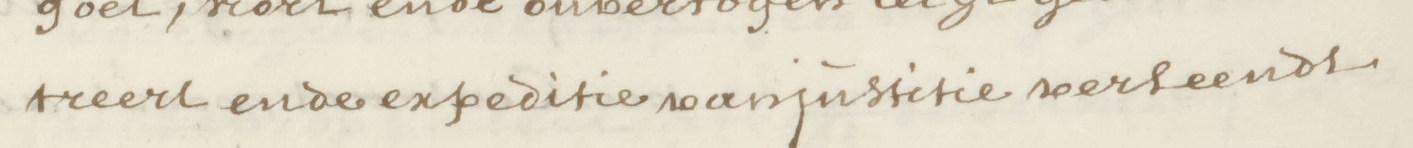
treert ende expeditie van justitie verleendt
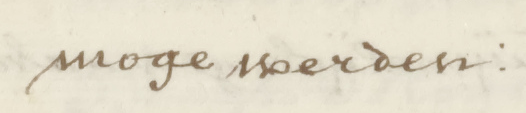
moge werden:
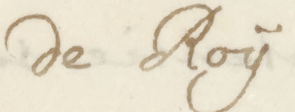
de Roij
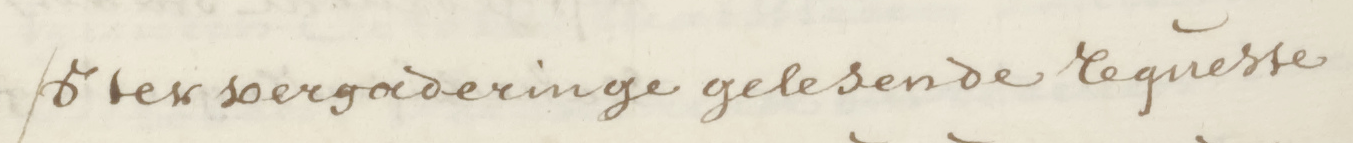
Is ter vergaderinge gelesen de requeste
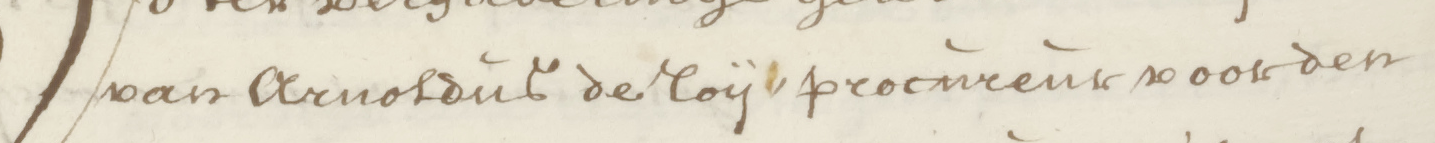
van Arnoldus de Roij, procureur voor den
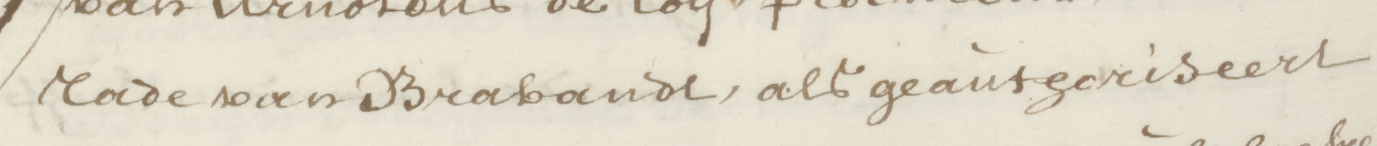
Rade van Brabandt, als geautoriseert
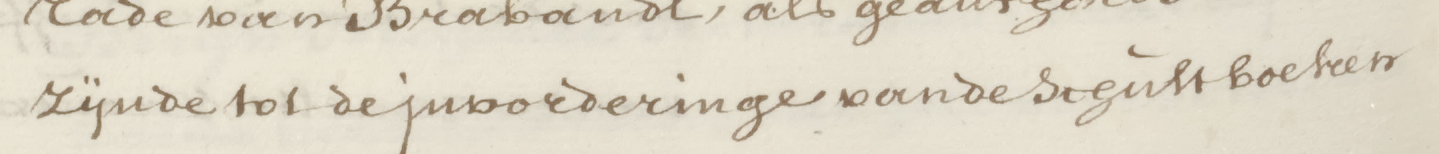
zijnde tot de invorderinge vande schultboeken
